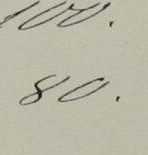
80
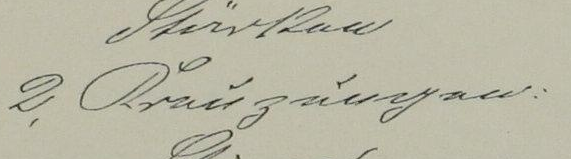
2. Kreuzungen:
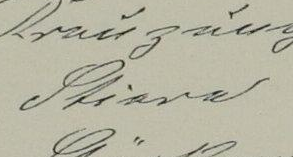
Stiere
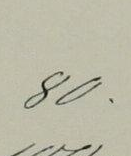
80
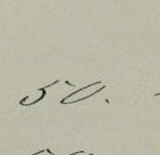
50
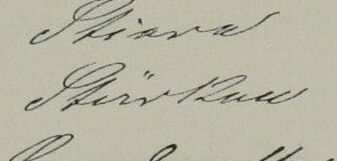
Stärken
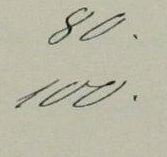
100
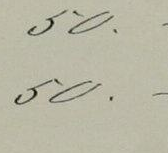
50
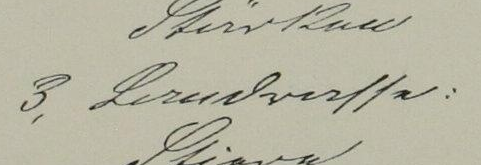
3. Landrasse:
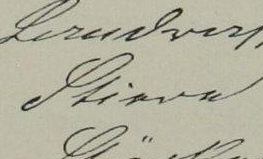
Stiere
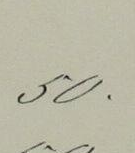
50
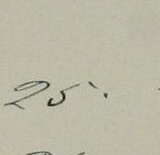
25
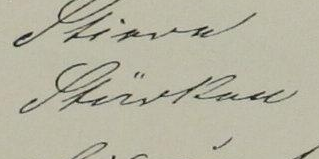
Stärken
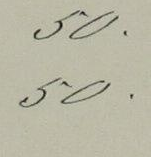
50
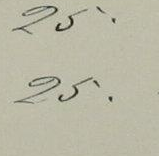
25
